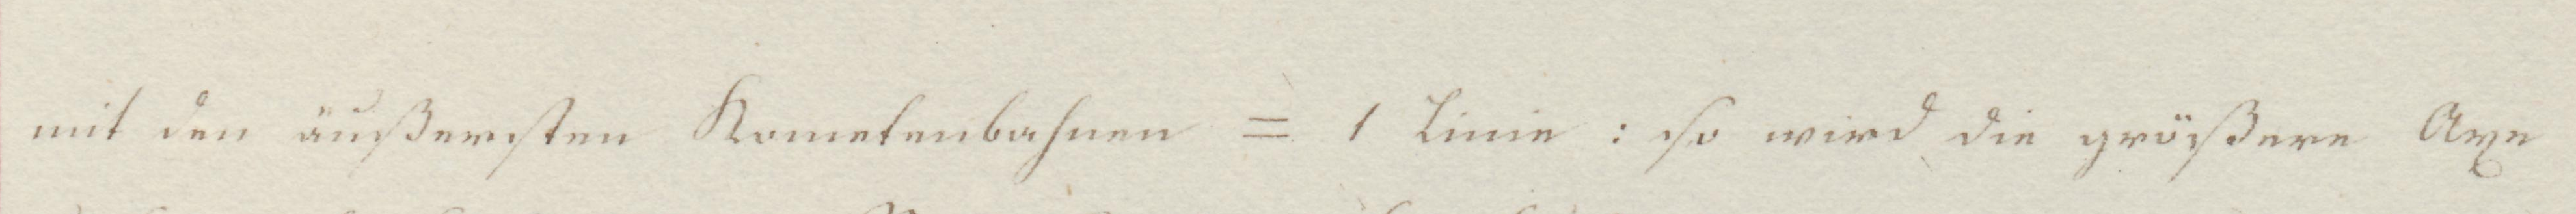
mit den äußersten Kometenbahnen 1 Linie: so wird die größere Axe
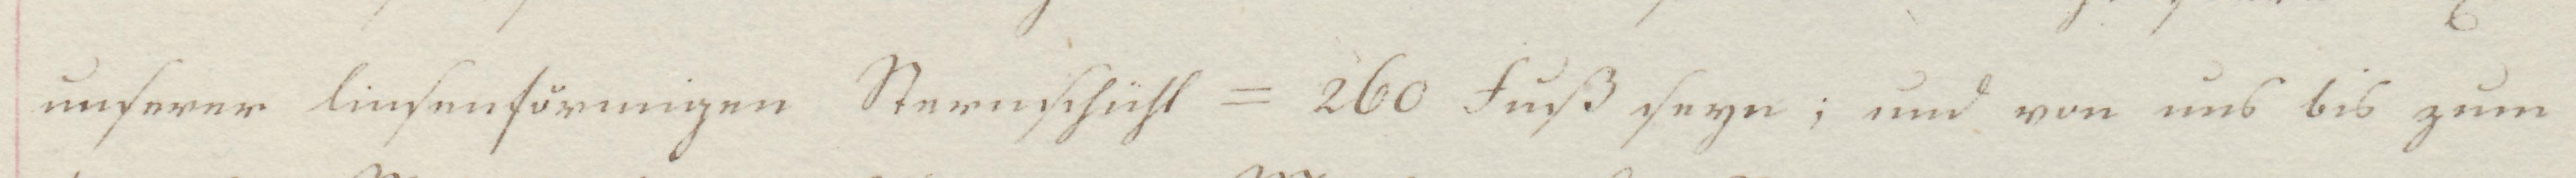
unserer linsenförmigen Sternschicht 260 Fuß seyn; und von uns bis zum
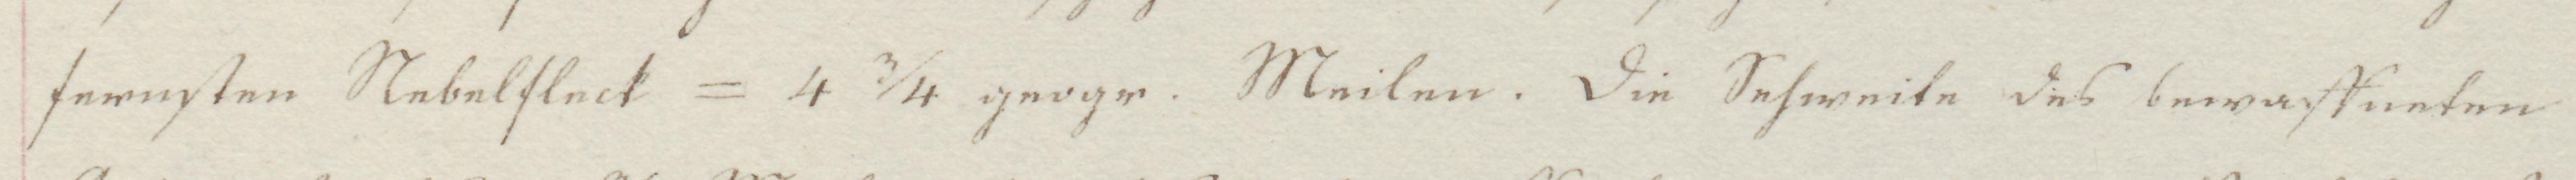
fernsten Nebelfleck 4¾ geogr. Meilen. Die Sehweite des bewaffneten
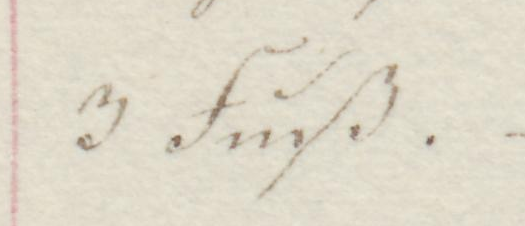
3 Fuß. –
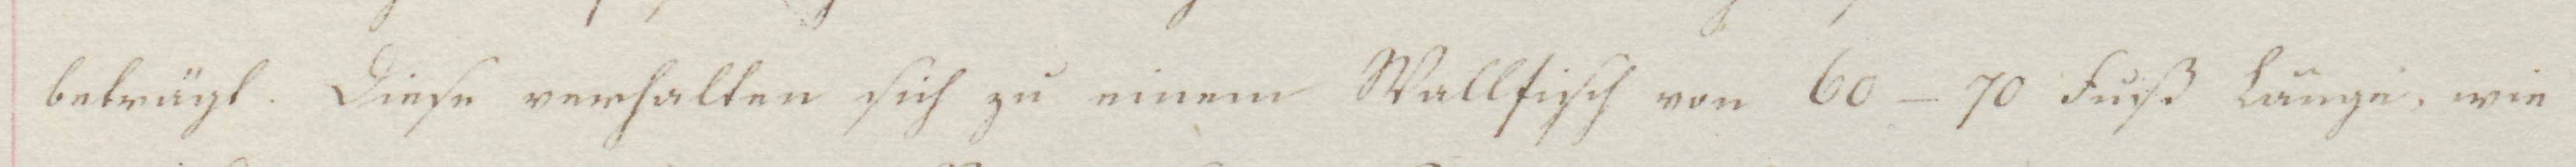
beträgt. Diese verhalten sich zu einem Wallfisch von 60–70 Fuß Länge, wie
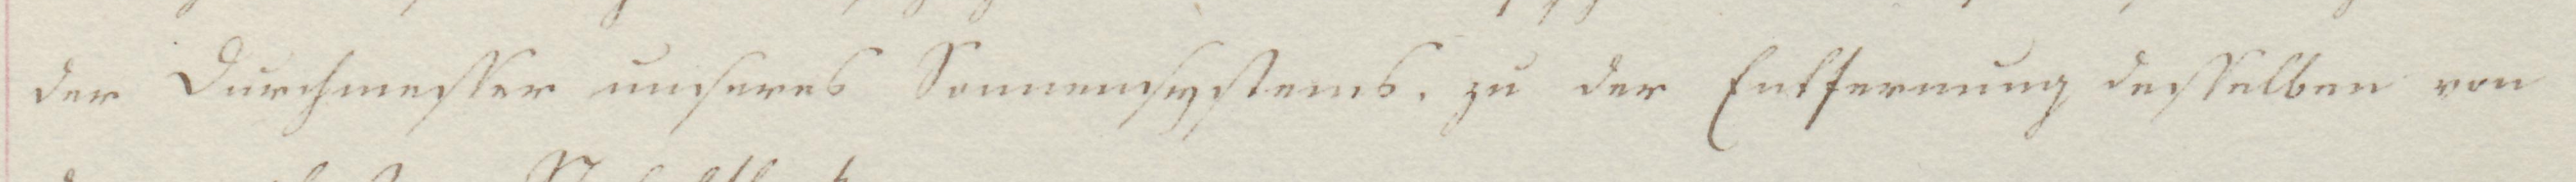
der Durchmesser unseres Sonnensystems, zu der Entfernung desselben von
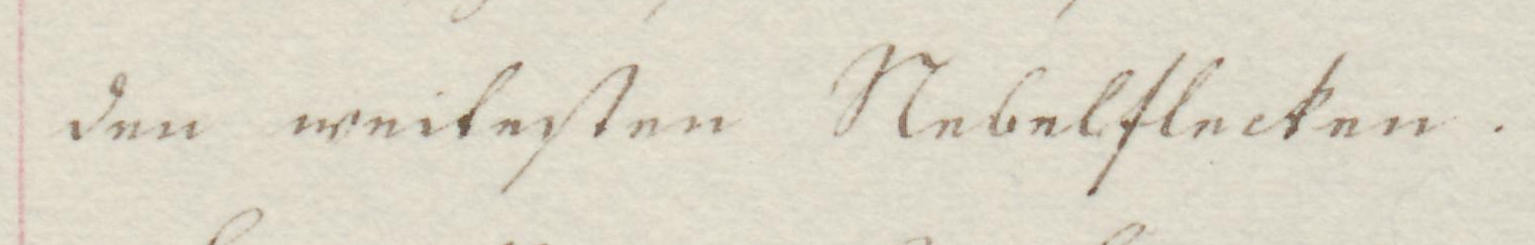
den weitesten Nebelflecken.
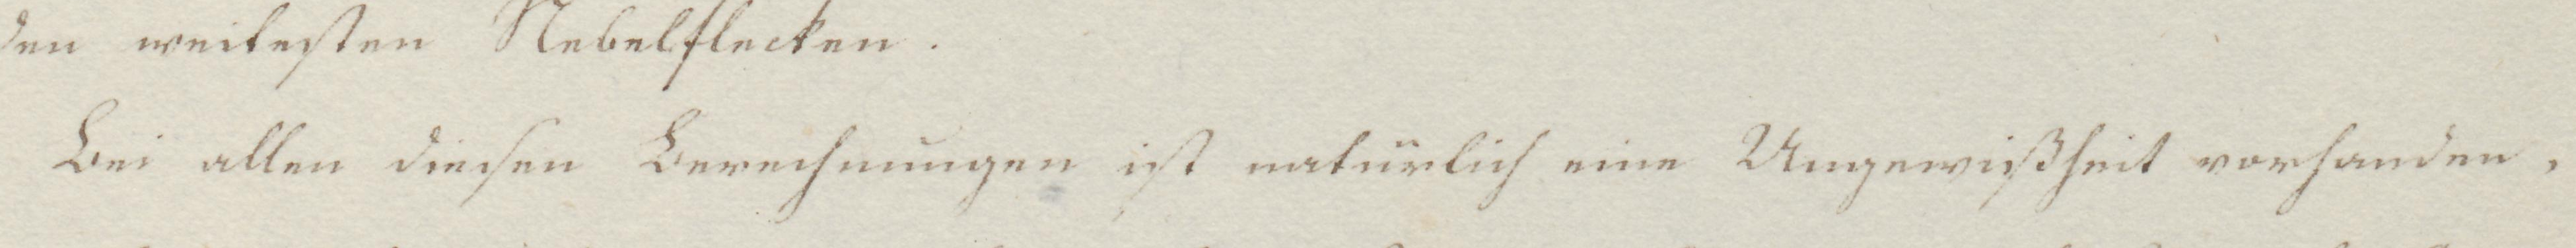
Bei allen diesen Berechnungen ist natürlich eine Ungewißheit vorhanden,
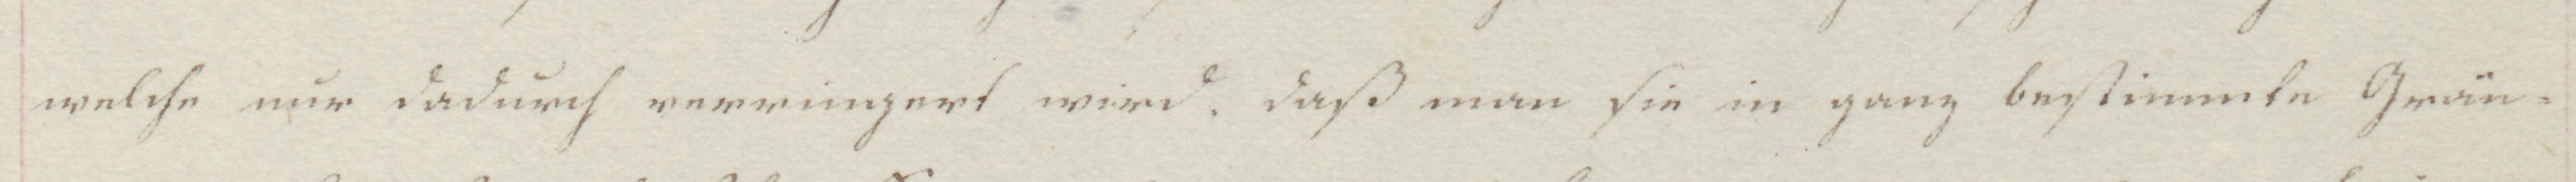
welche nur dadurch verringert wird, daß man sie in ganz bestimmte Grän-
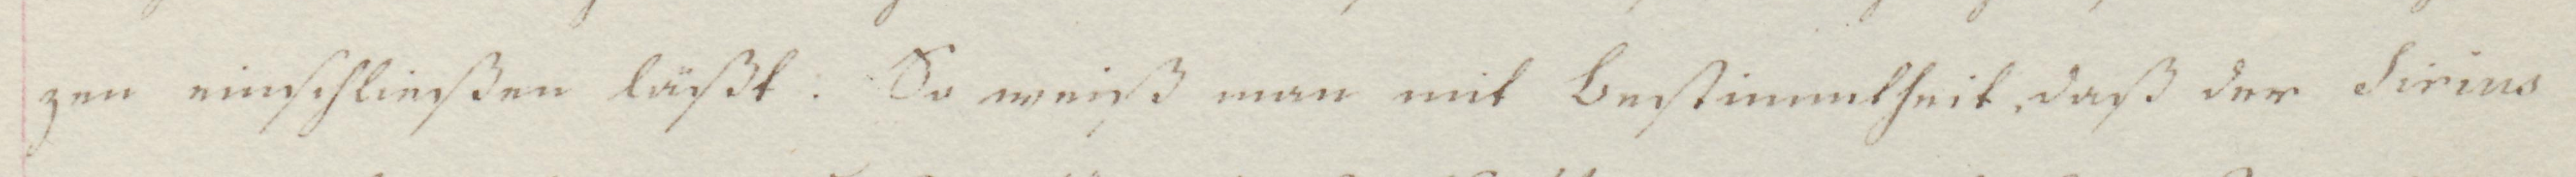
zen einschließen läßt. So weiß man mit Bestimmtheit, daß der Sirius
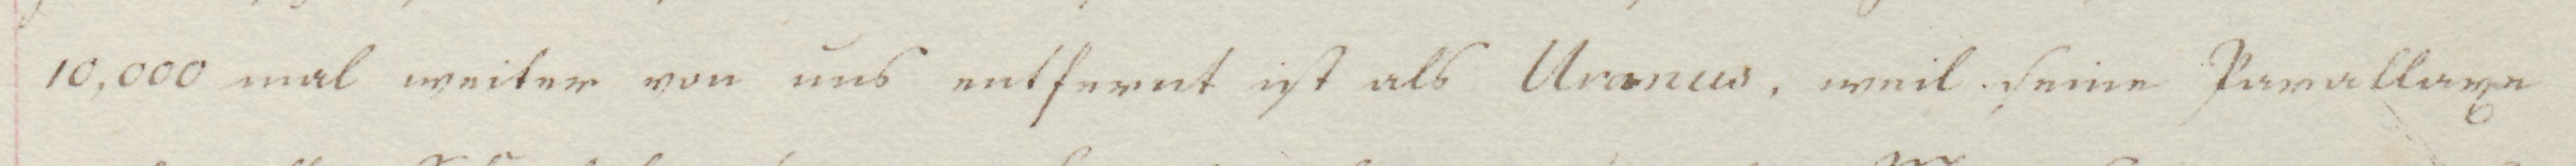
10,000 mal weiter von uns entfernt ist als Uranus, weil seine Parallaxe
